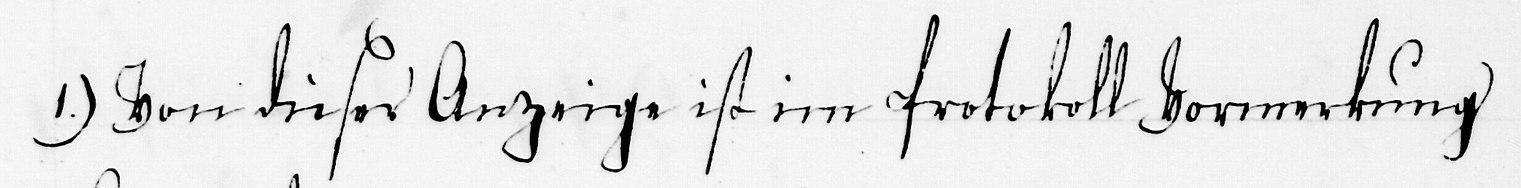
1.) Von dieser Anzeige ist im Protokoll Vormerkung
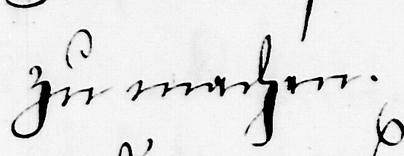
zu machen.
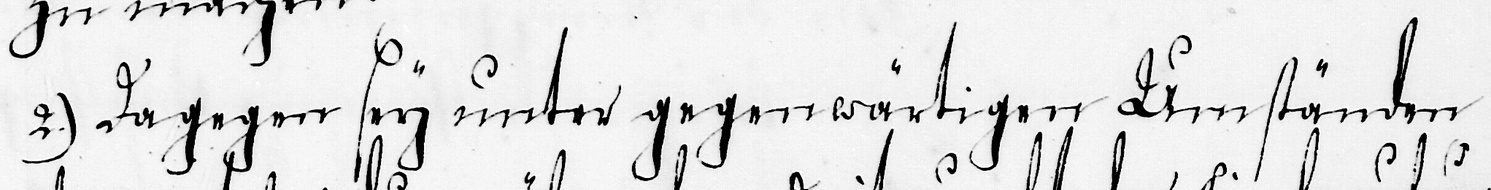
2.) Dagegen sey unter gegenwärtigen Umständen
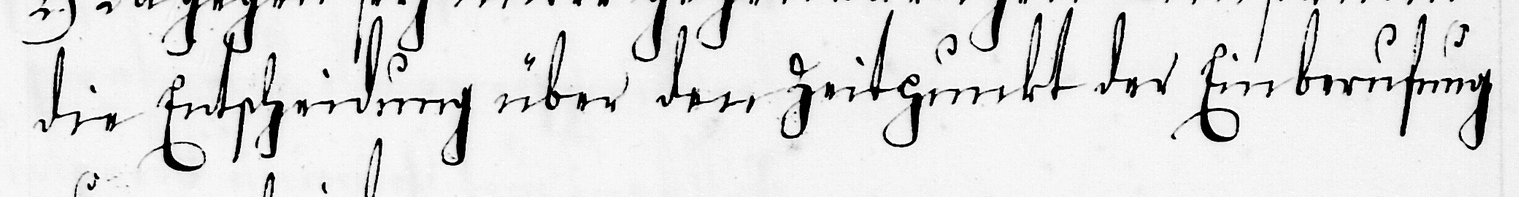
die Entscheidung über den Zeitpunkt der Einberufung
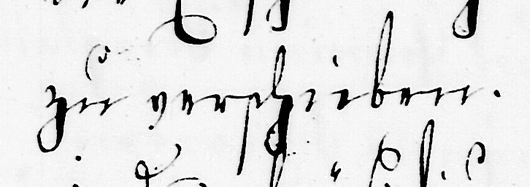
zu verschieben.
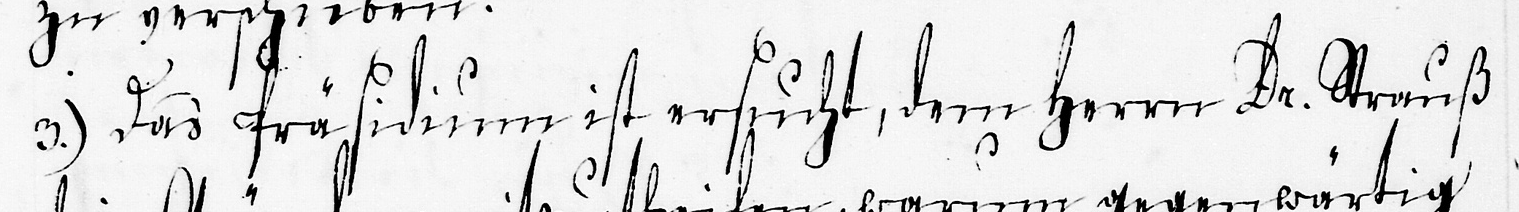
3.) Das Präsidium ist ersucht, dem Herrn Dr. Strauß
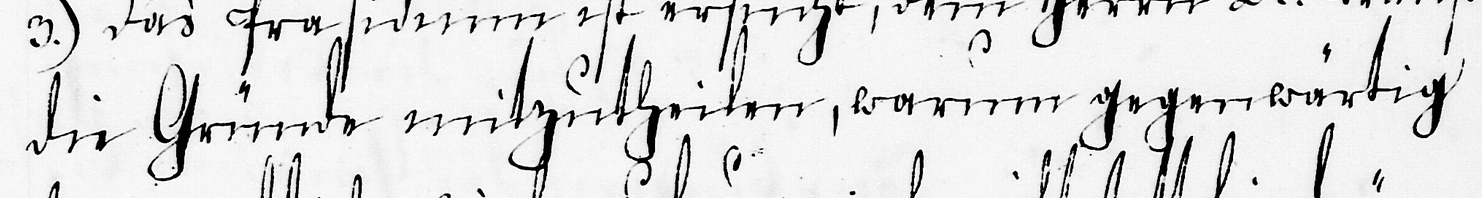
die Gründe mitzutheilen, warum gegenwärtig
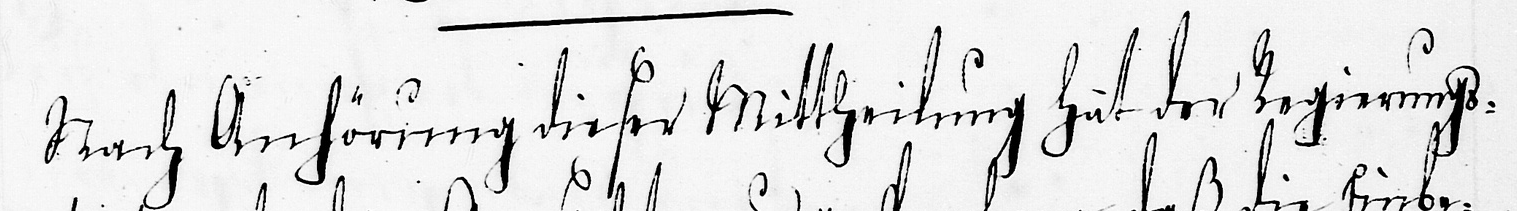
Nach Anhörung dieser Mittheilung hat der Regierungs¬
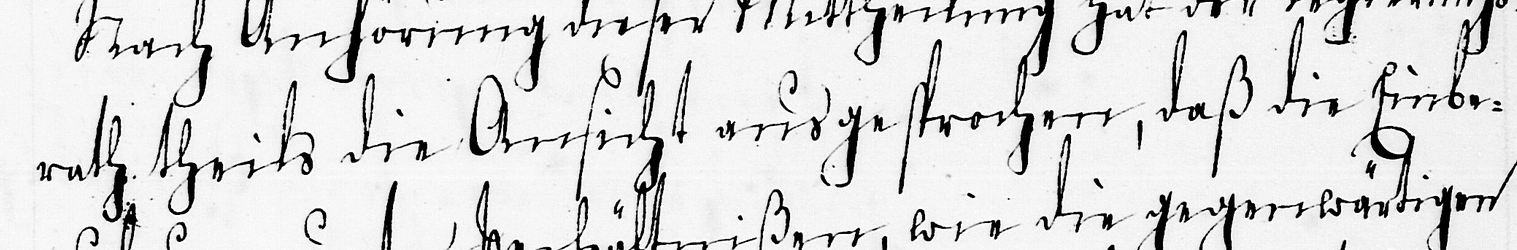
rath theils die Ansicht ausgesprochen, daß die Einbe¬
